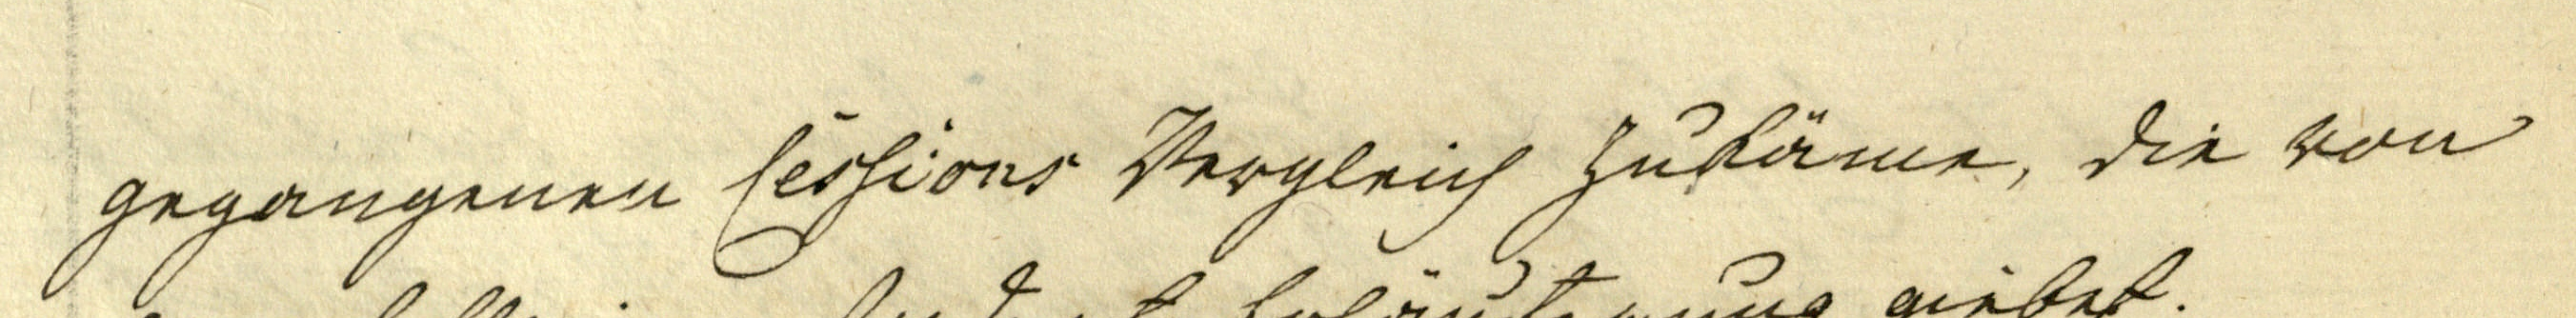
gegangenen Cessions Vergleich zukäme, die von
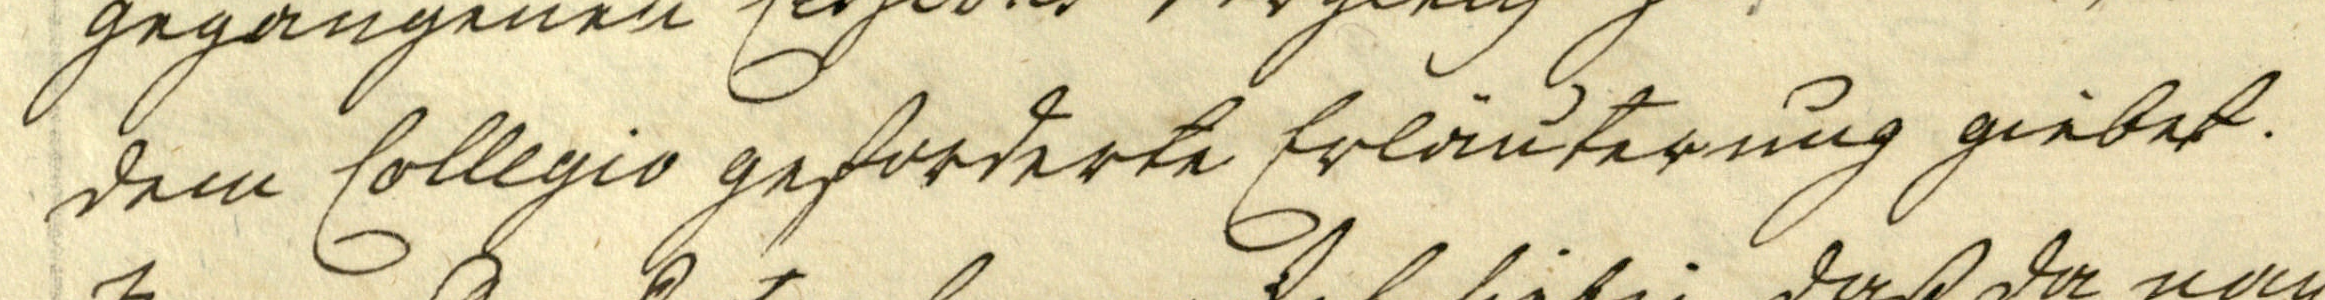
dem Collegio geforderte Erläuterung giebet.
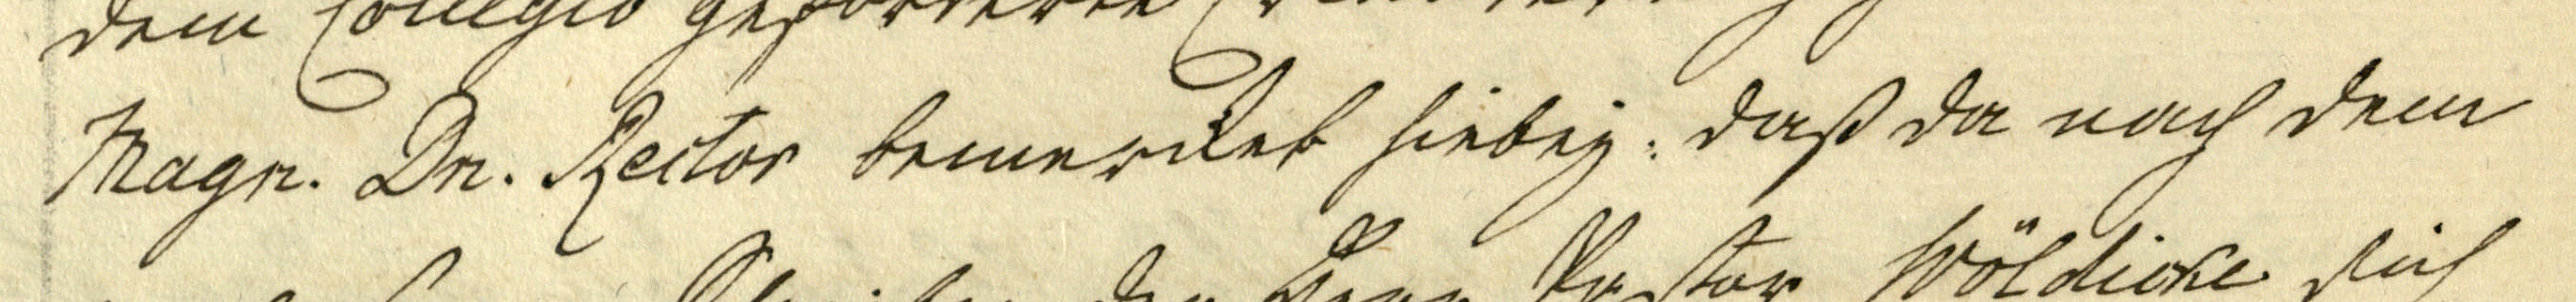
Magn. Dn. Rector bemercket hiebeÿ, daß da nach dem
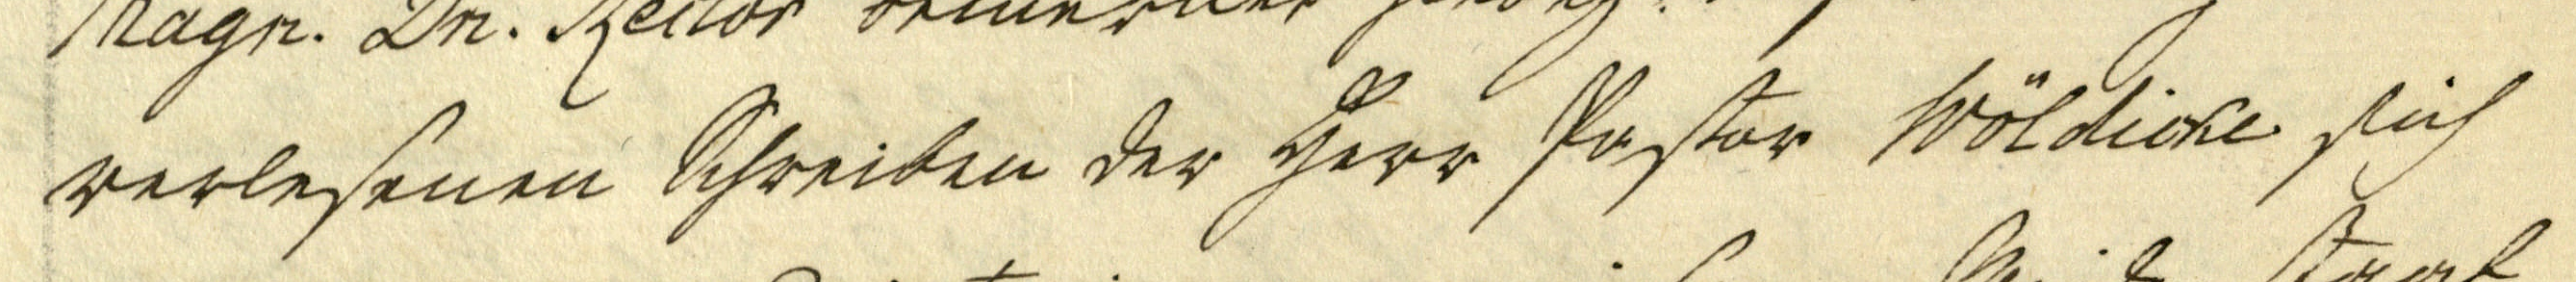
verlesenen Schreiben der Herr Pastor Wöldicke sich
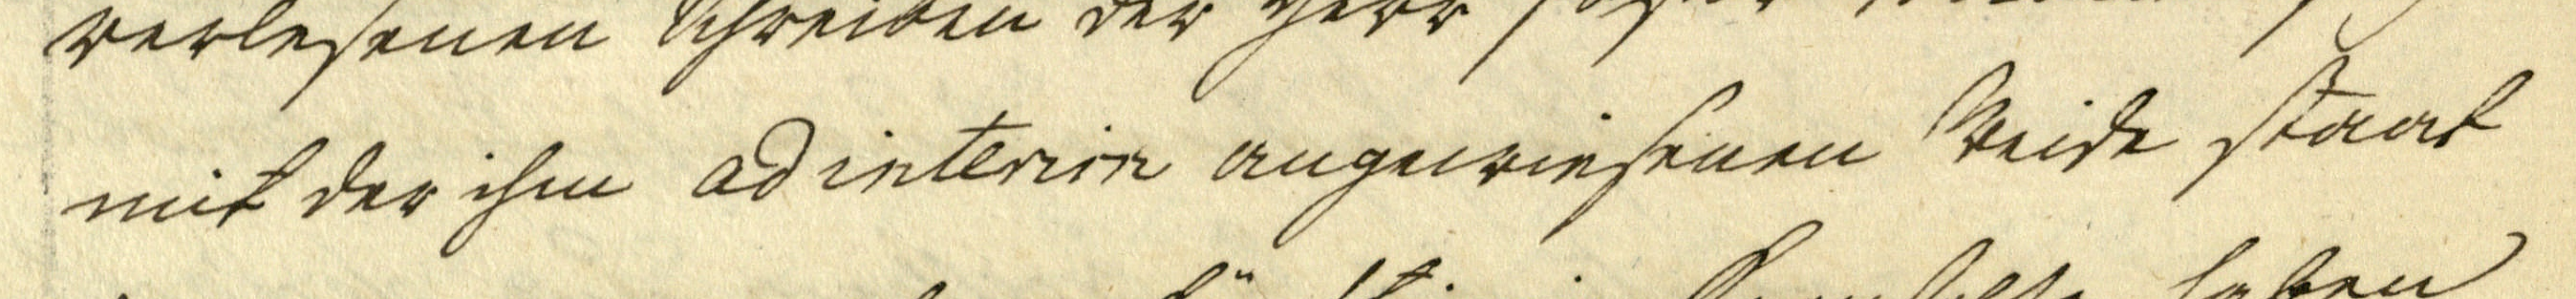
mit der ihm ad interim angewiesenen Weide staat
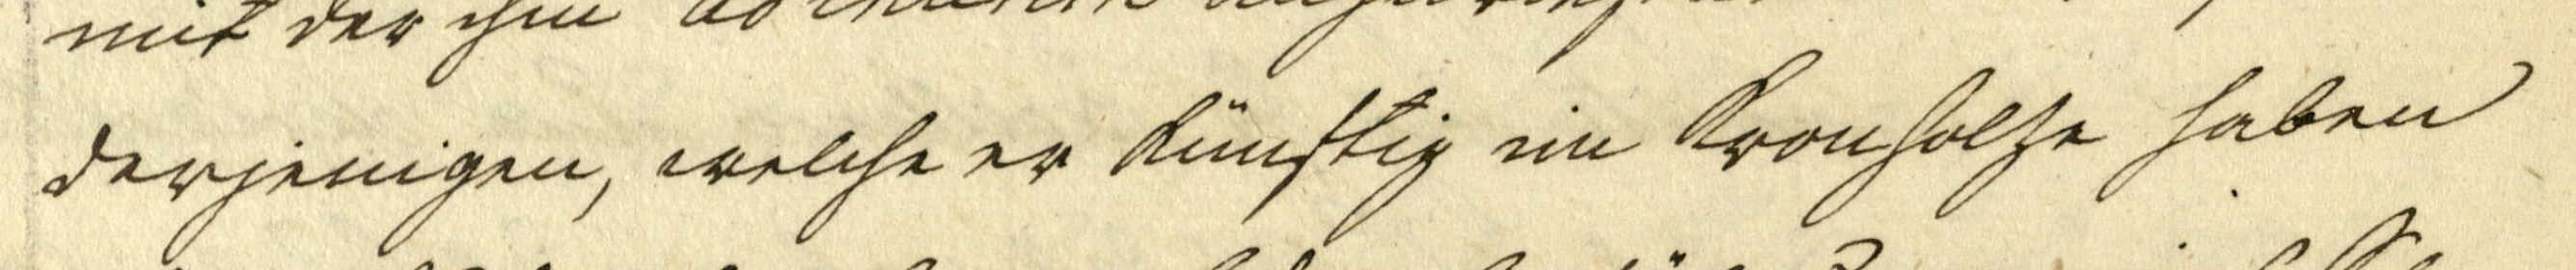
derjenigen, welche er künftig in Kronholze haben
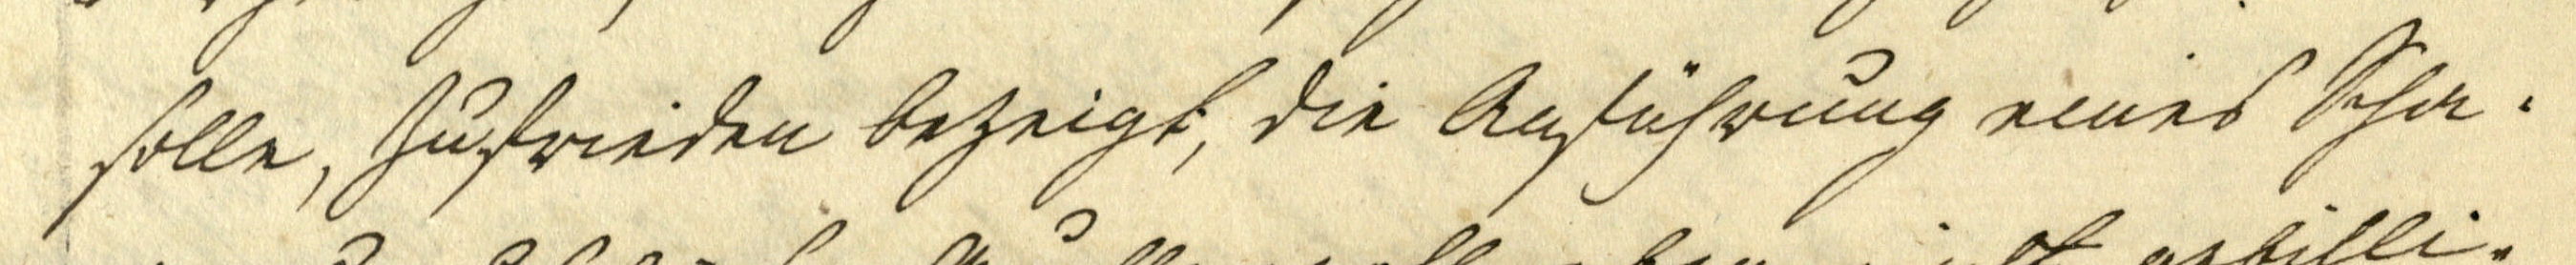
solle, zufrieden bezeigt, die Anführung eines Scha¬
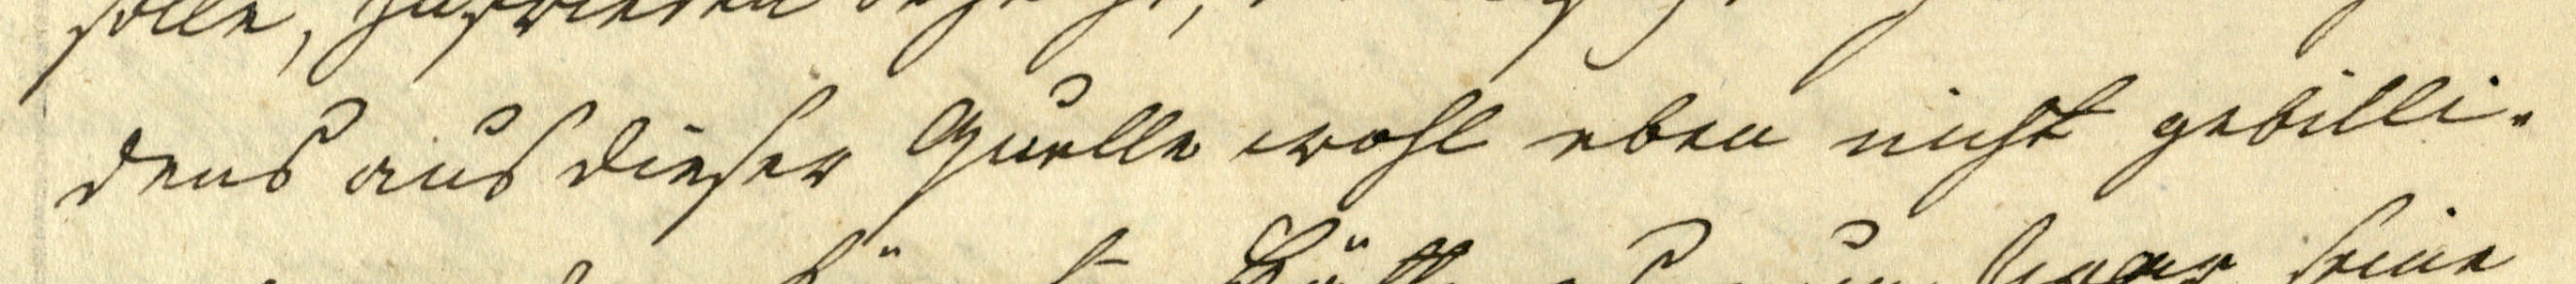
dens aus dieser Quelle wohl eben nicht gebilli¬
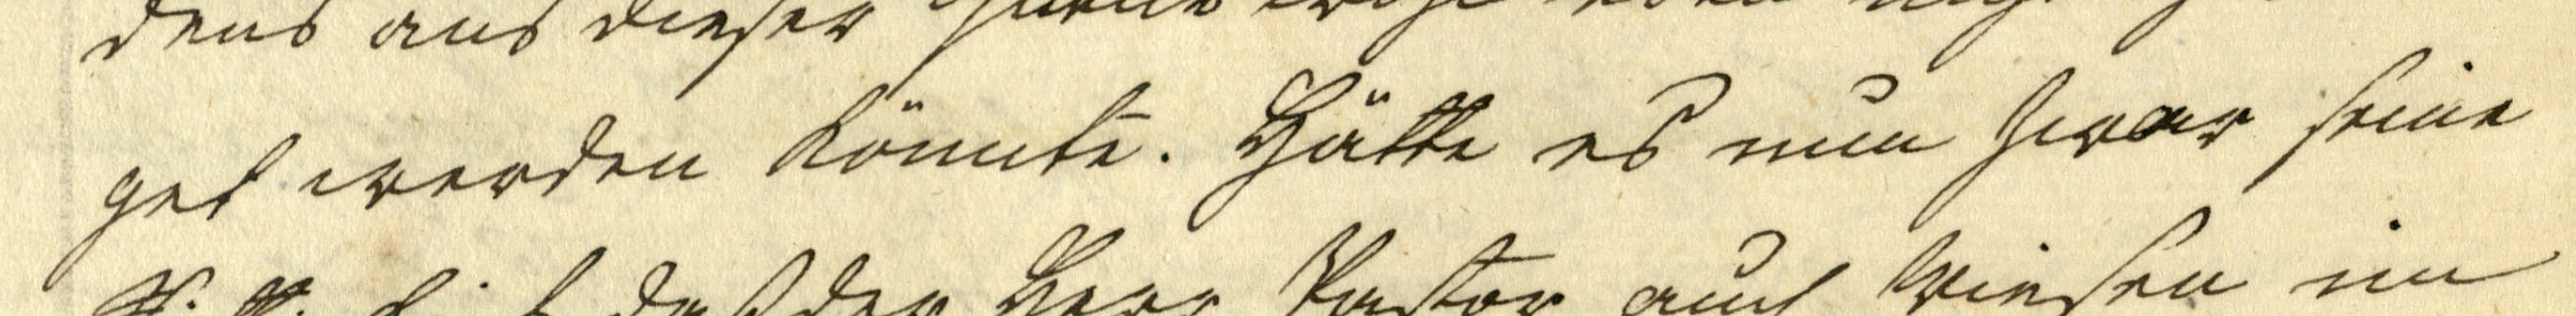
get werden könnte. Hätte es nun zwar seine
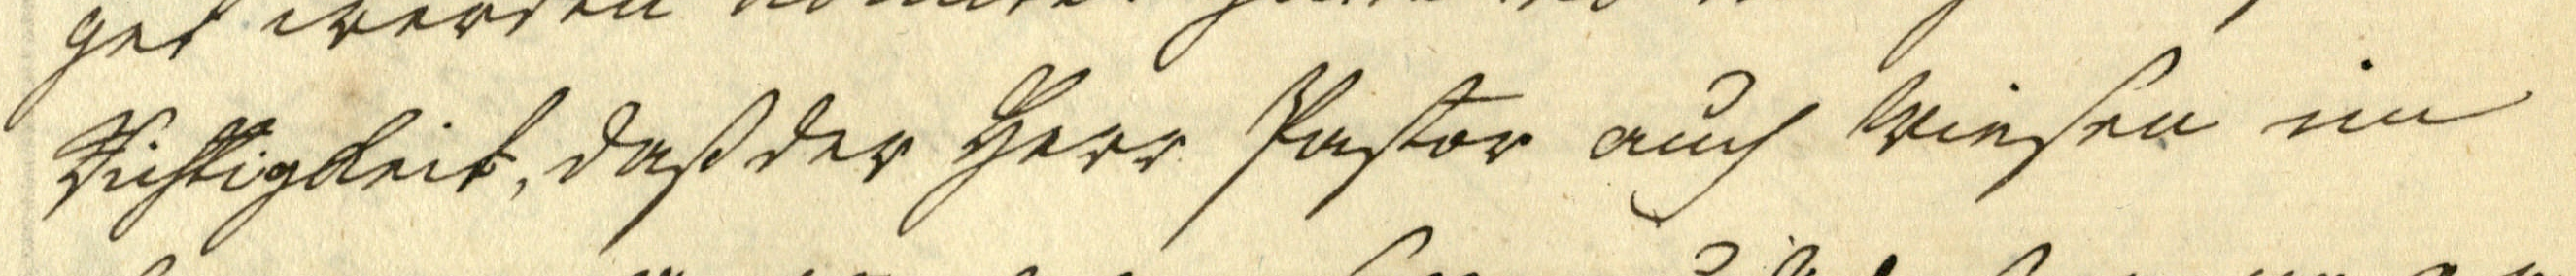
Richtigkeit, daß der Herr Pastor auch Wiesen im
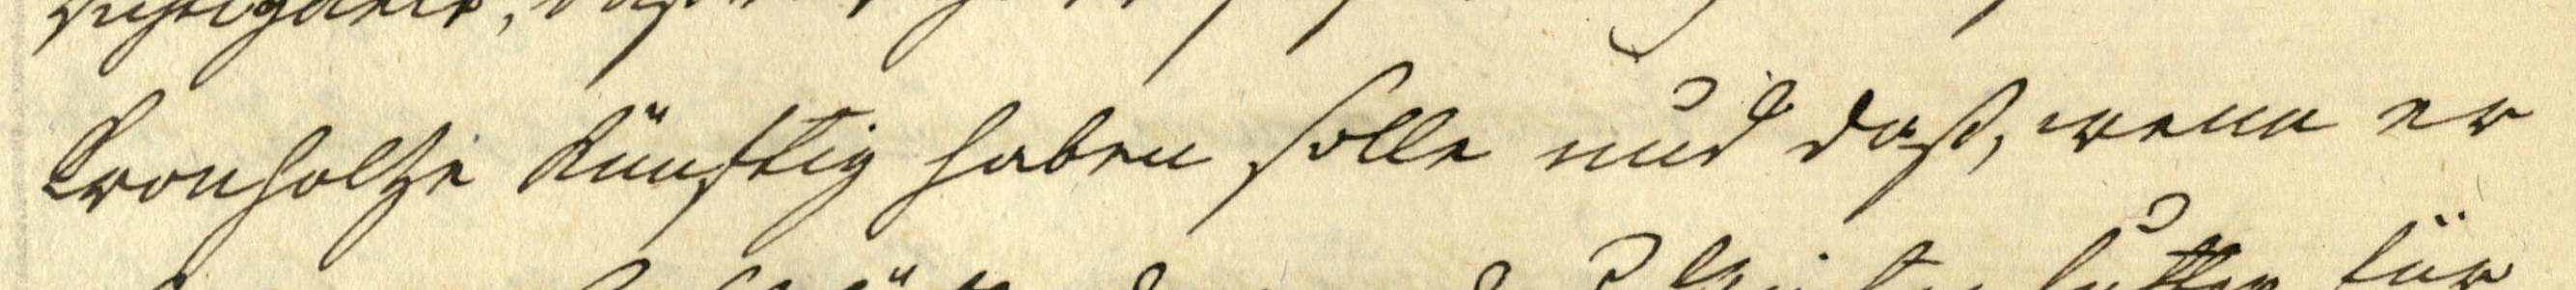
Kronholze künftig haben solle und daß, wenn er
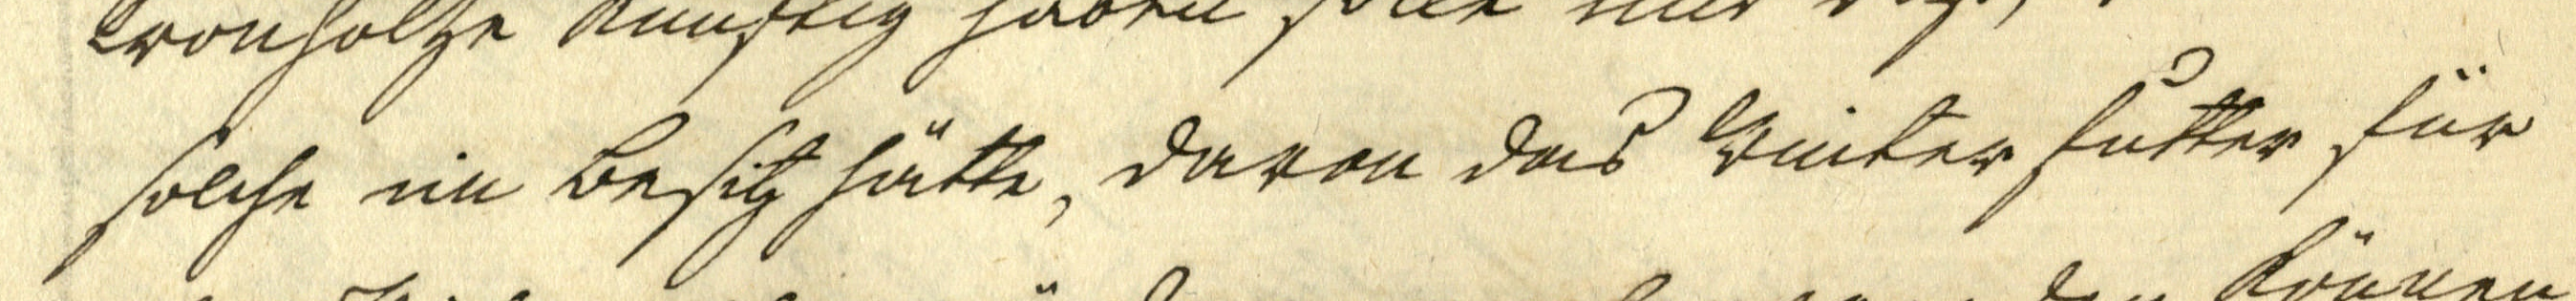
solche im Besitz hätte, davon das Winter futter für
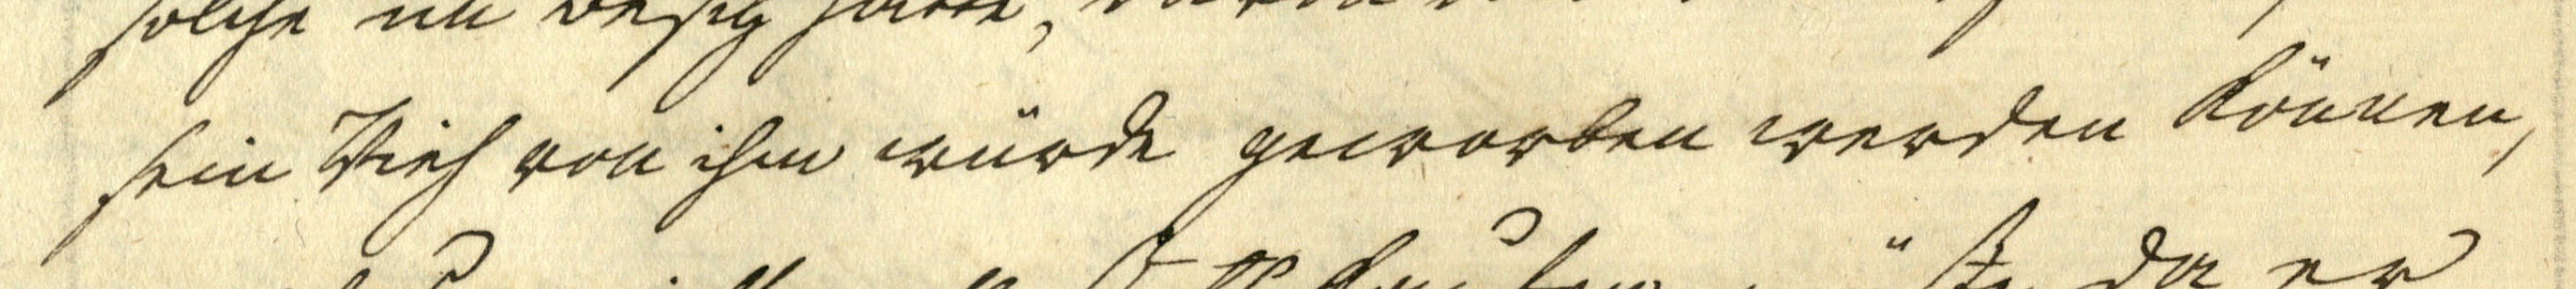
sein Vieh von ihm würde geworben werden können,
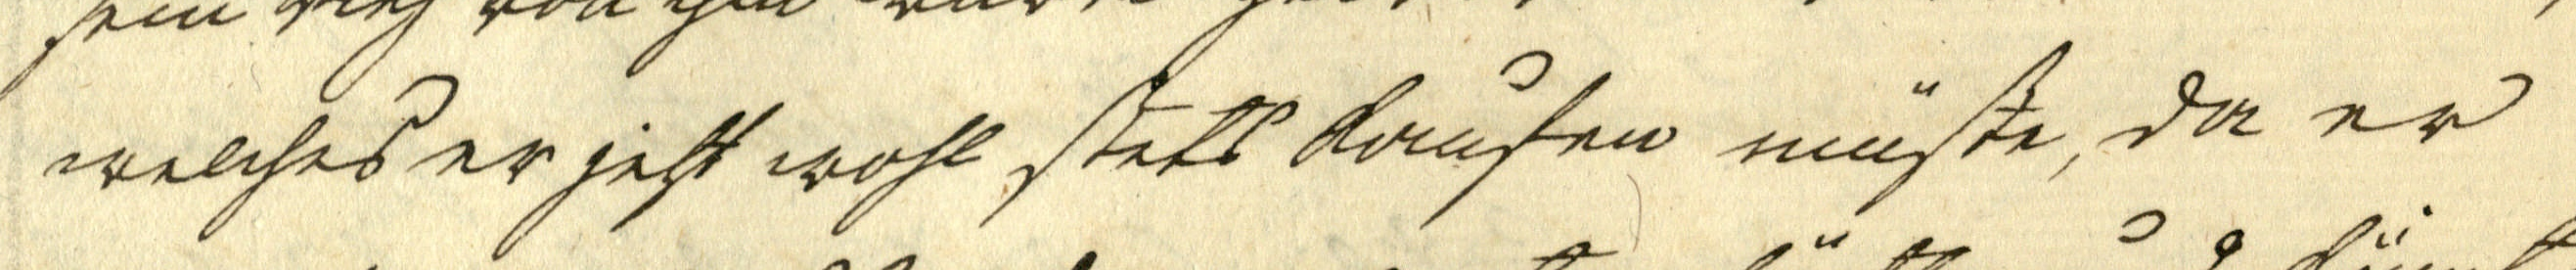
welches er jetzt wohl stets kaufen müßte, da er
